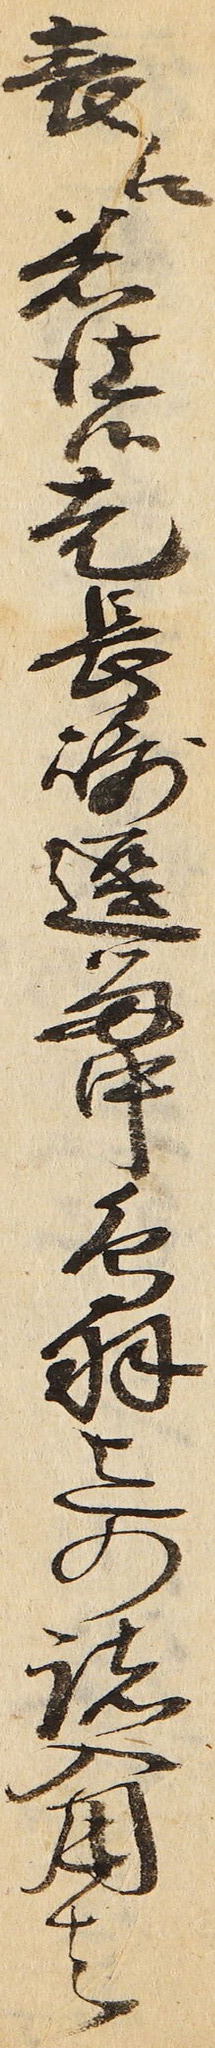表え着仕候尤長崎逗留中鳥羽迄の諸入用は
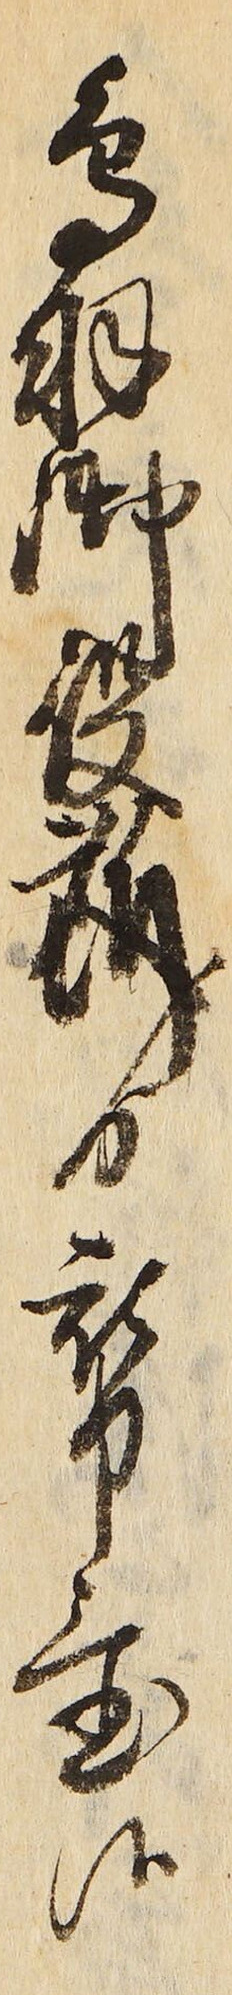鳥羽御役所ゟ被申置候
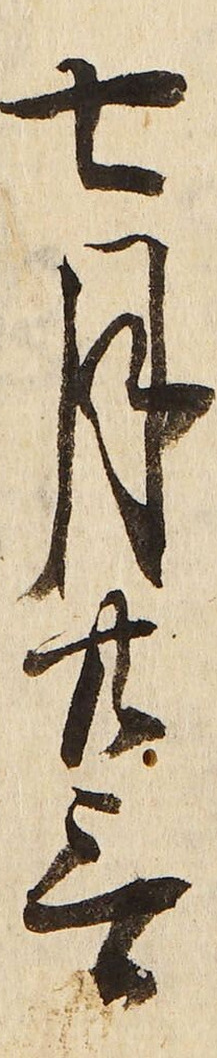七月廿三日

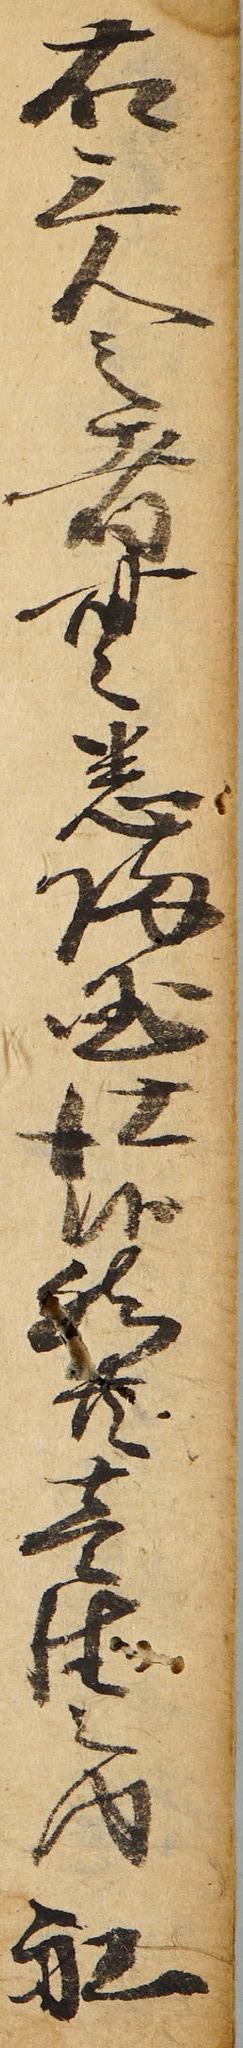右三人之者無恙帰国仕候然共壱生之内船
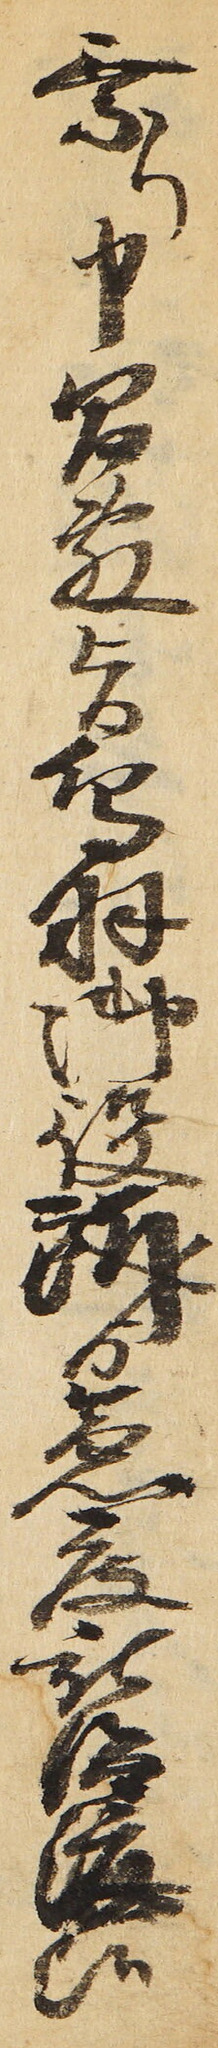乗り申間敷旨鳥羽御役所ゟ急度被仰渡候
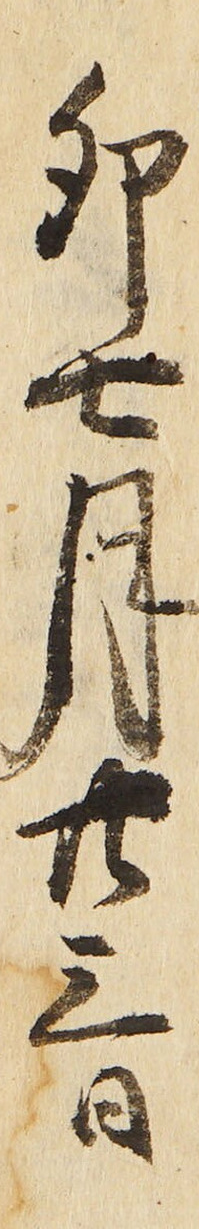卯七月廿三日
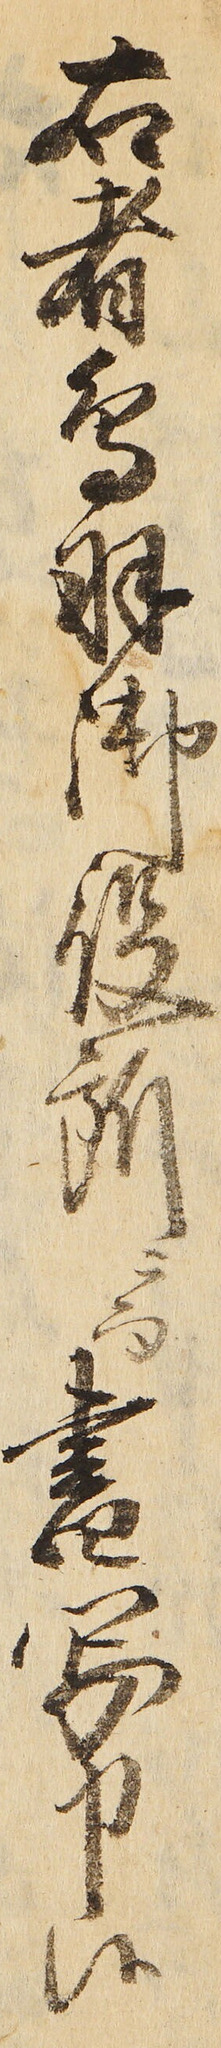右者鳥羽御役所にて書写申候
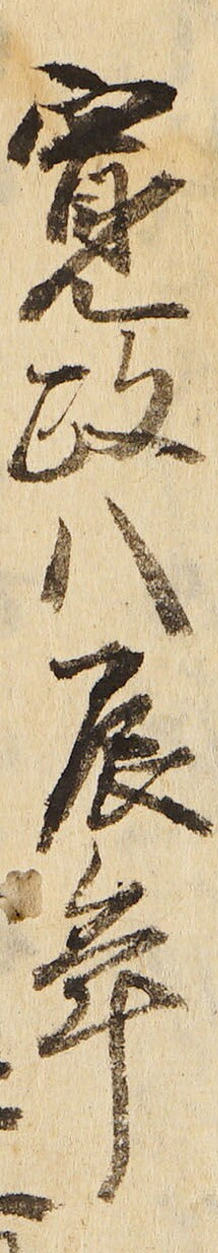寛政八辰年
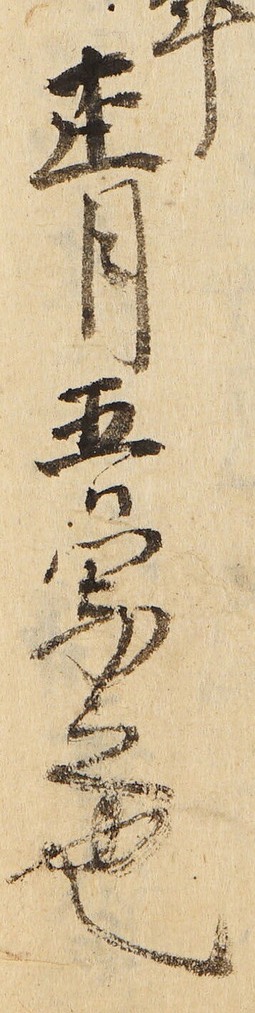正月五日写之也
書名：志州鳥羽流船留書
